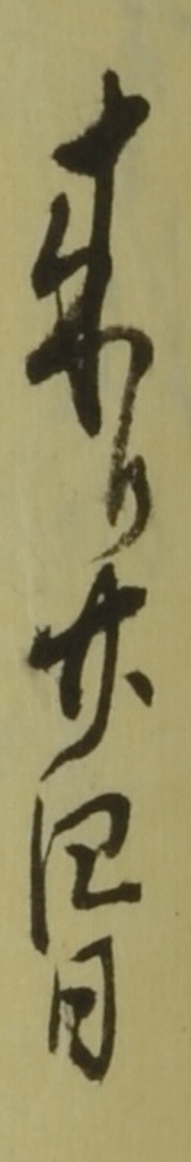来ル廿四日
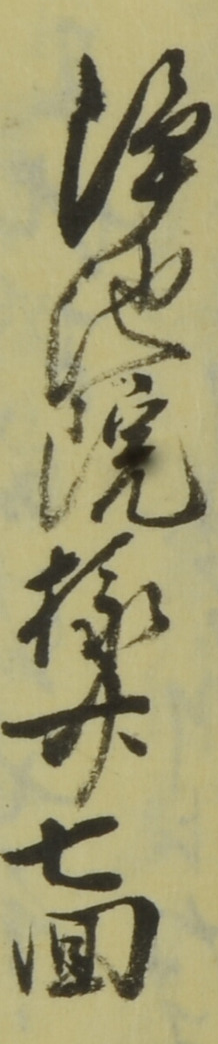浄池院様廿七回

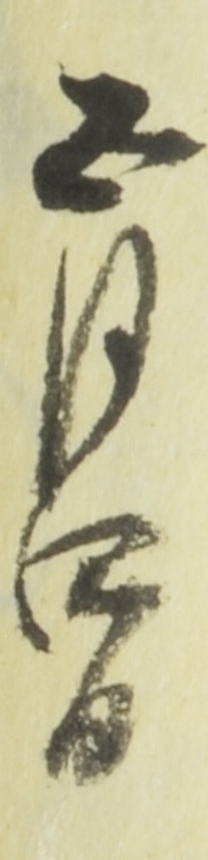五月四日
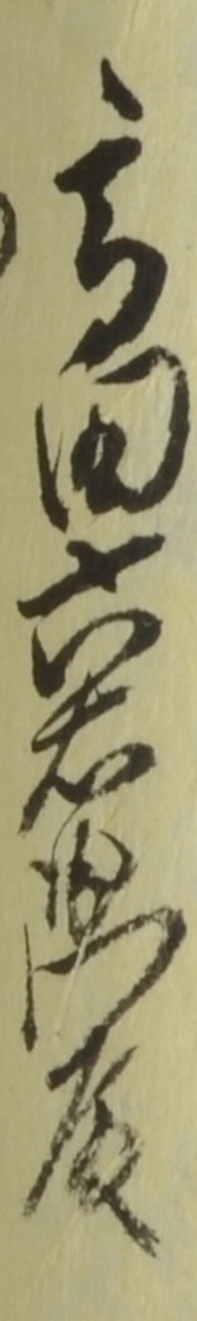高田六右衛門殿
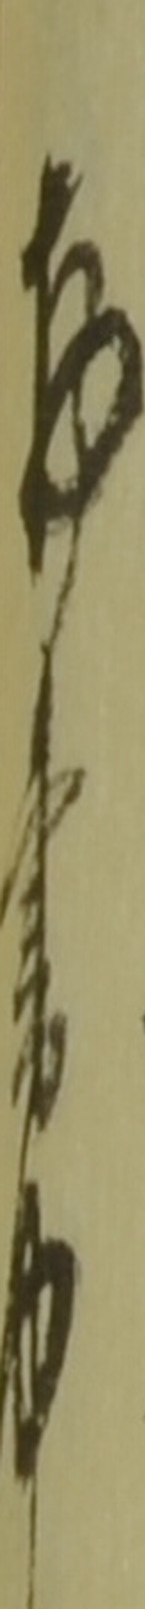物書中
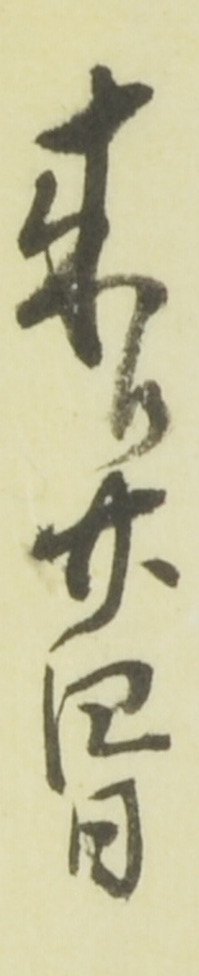来ル廿四日
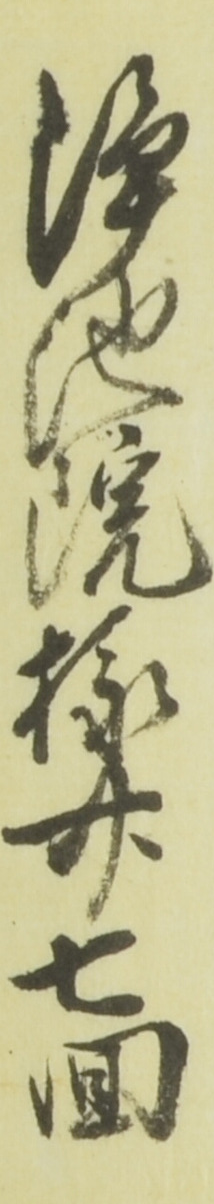浄池院様廿七回
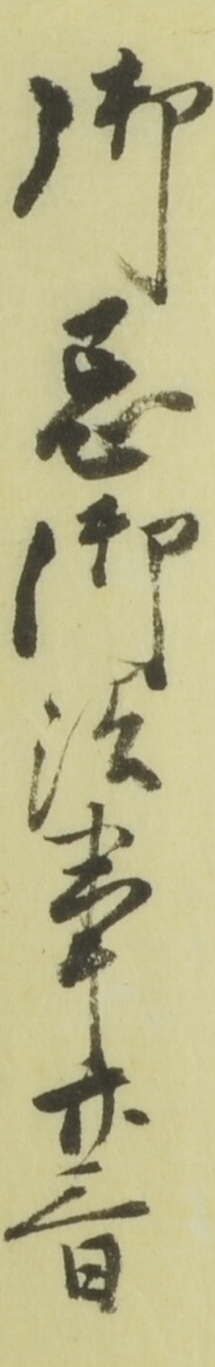御忌御法事廿三日
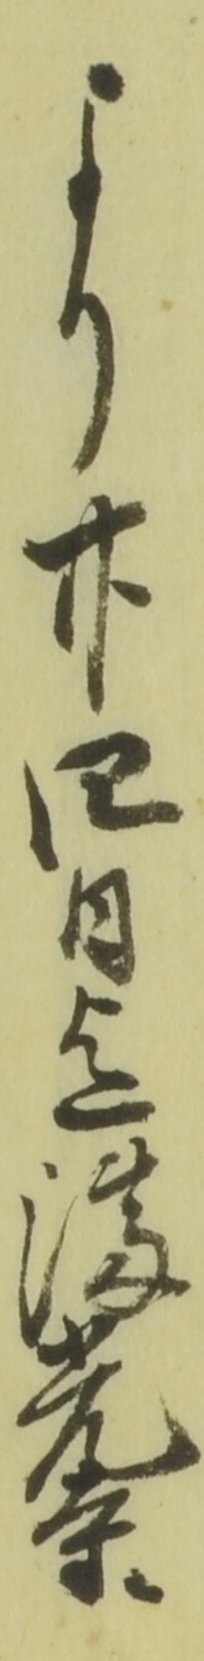より廿四日迄済光寺
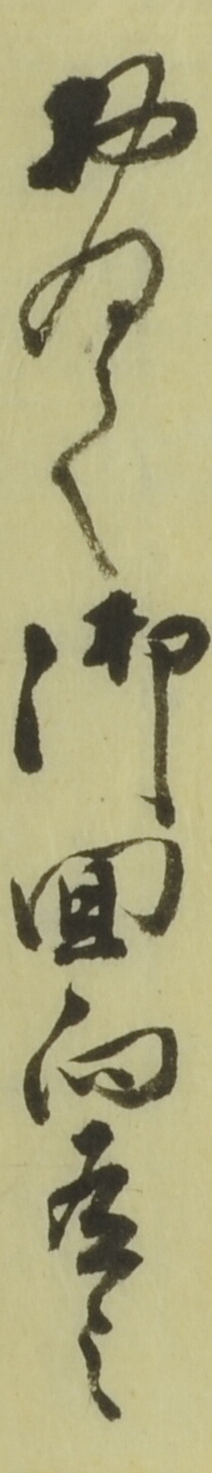おゐて御回向有之
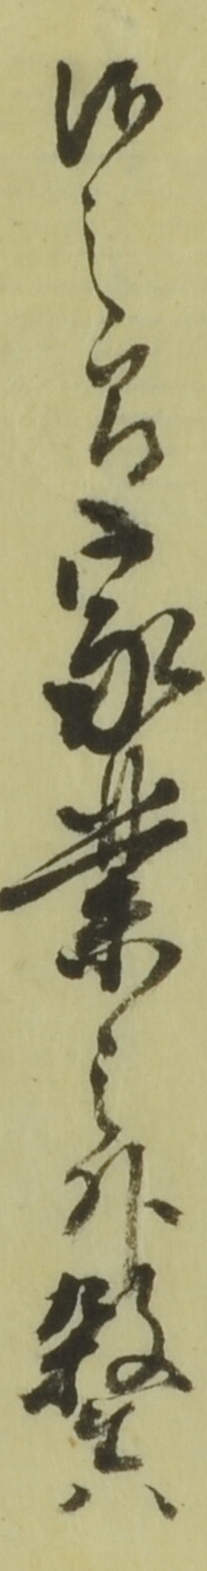候之間家業之外殺生ハ
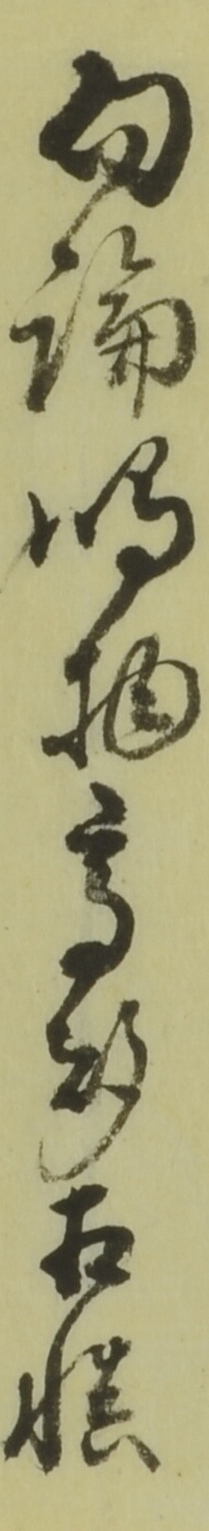勿論鳴物高声相慎
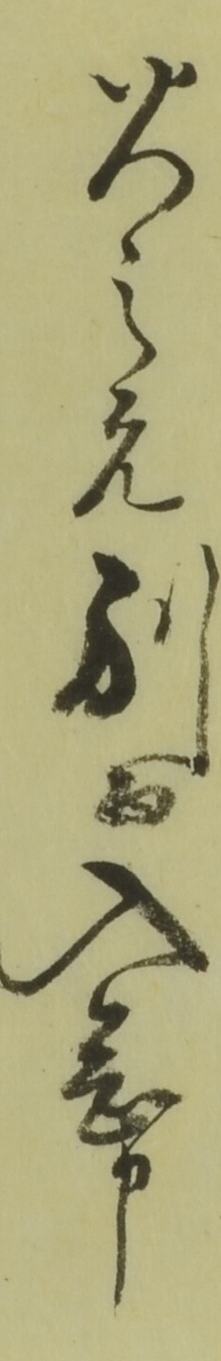火之元別而入念申
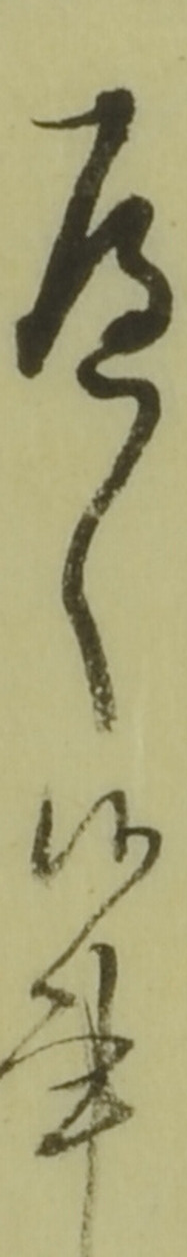へく候事
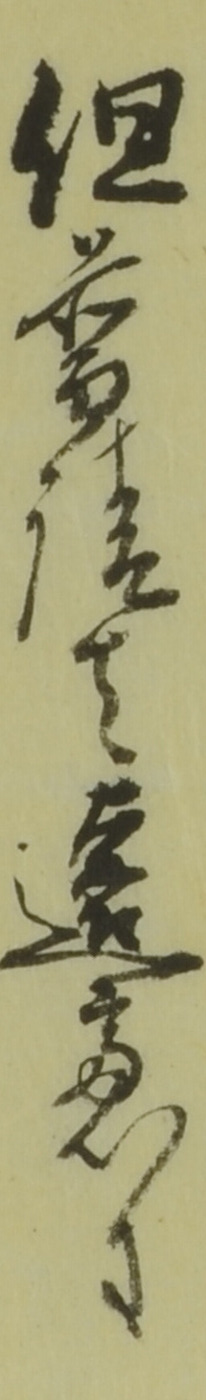但普請は遠慮に
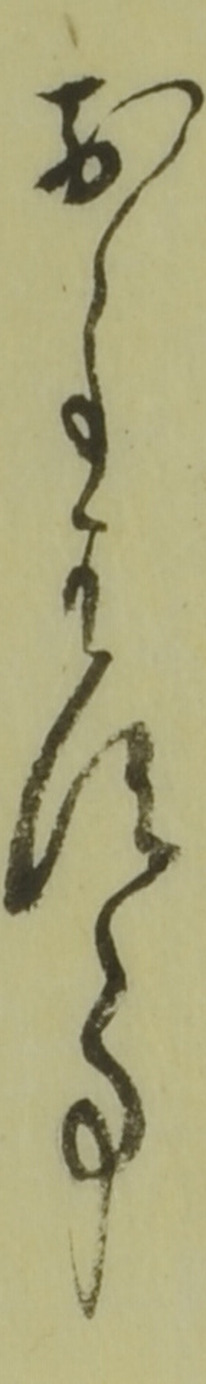およはす事
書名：御触書御書附控
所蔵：伊那市立高遠町図書館・合同会社AMANE
